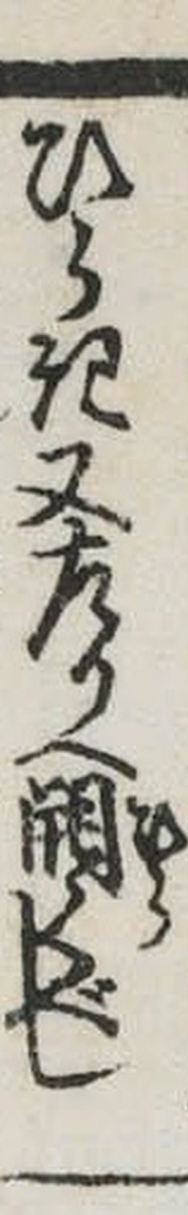ひらき又左りへ開くべし
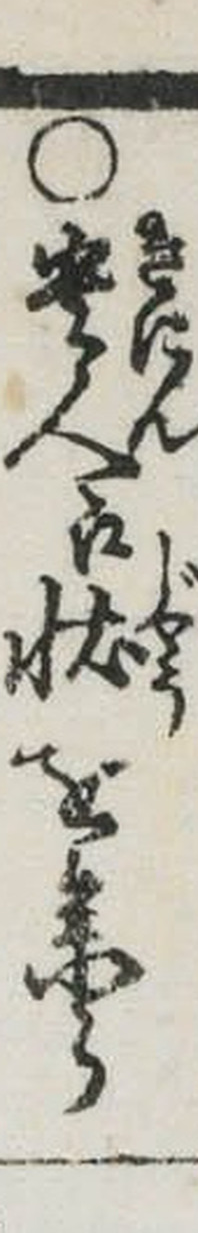○貴人え状を参ら
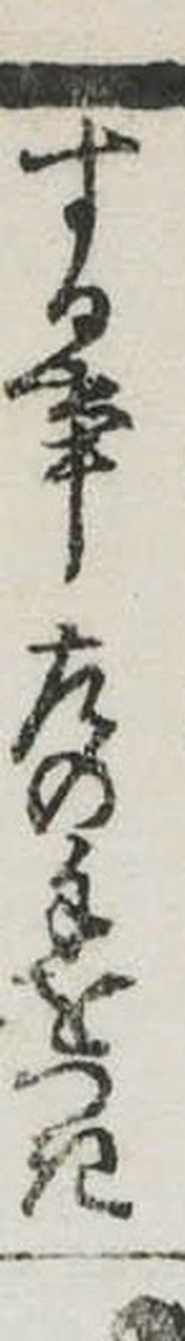する事左の手をつき
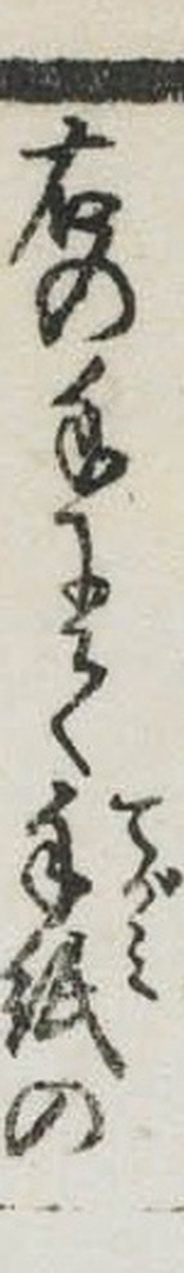右の手にて手紙の
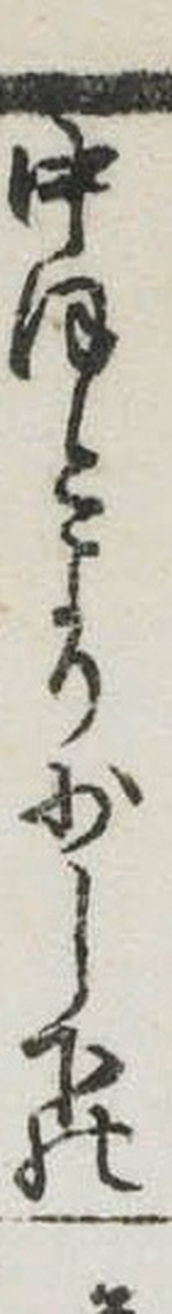中ほとより少し下の
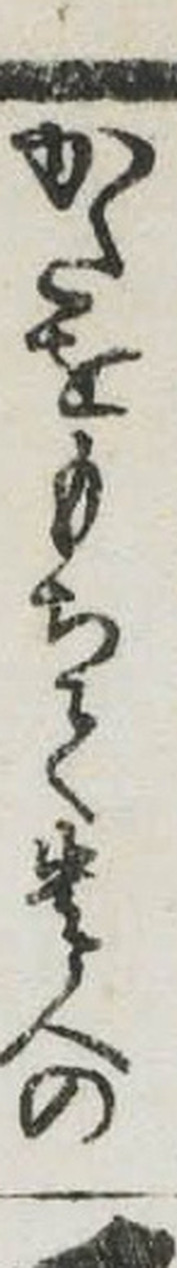かたをもちて貴人の
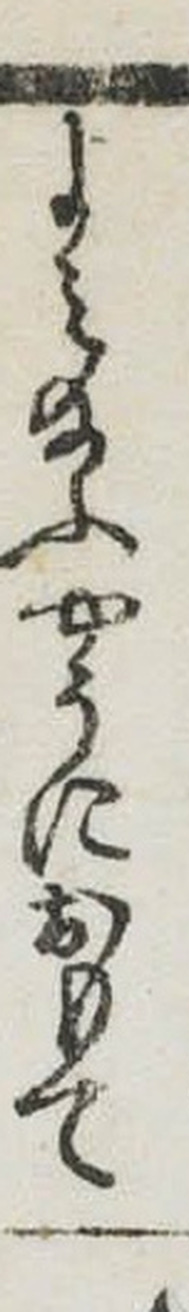よみ給ふやうにおもて
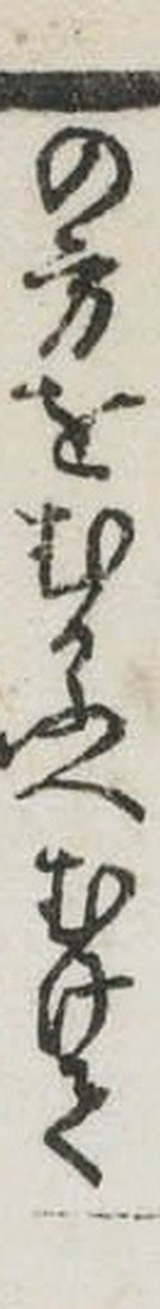の方をむかふへむけて
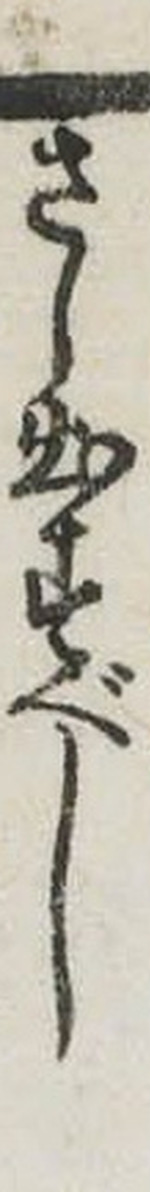さし出すべし
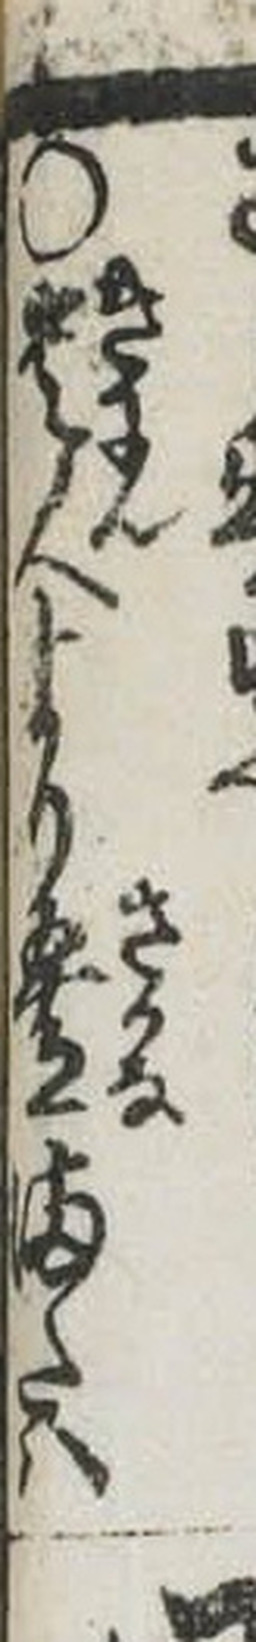○貴人より肴または
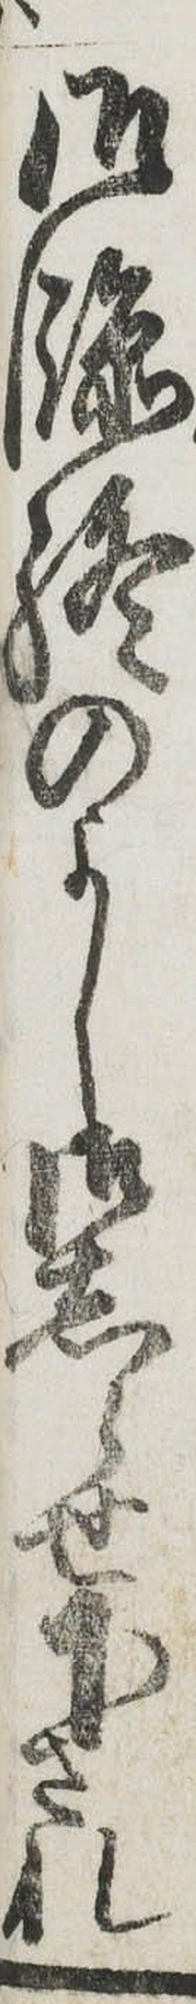御臨終のよし御しらせ下され
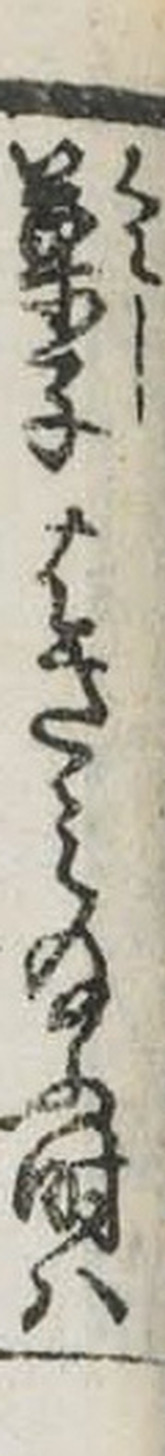菓子はさみ給ふ時は
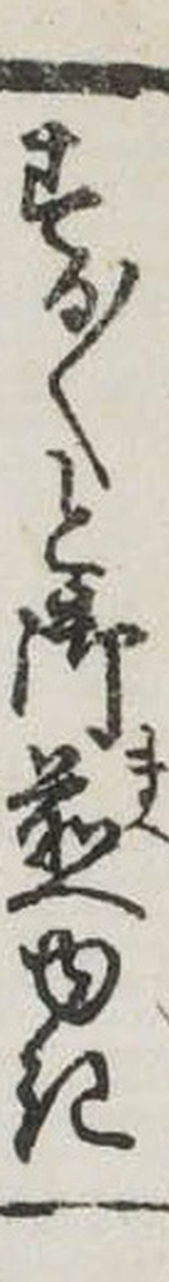する〳〵と御前へゆき
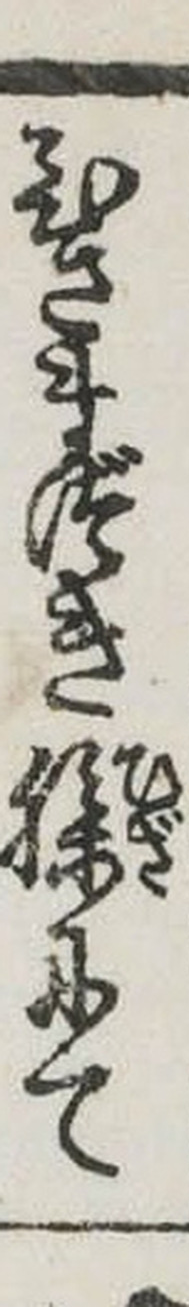ひさまづき膝にて
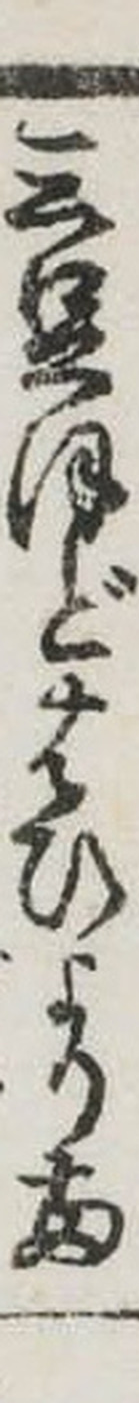三足ほどはひより両
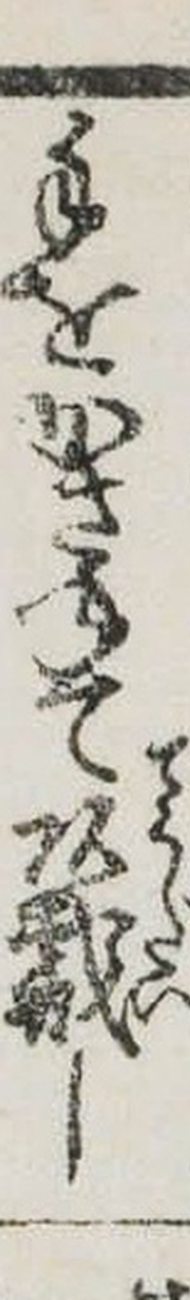手をかさねて頂戴し
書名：頭書萬用婦人手紙之文言
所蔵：東京学芸大学教育コンテンツアーカイブ
